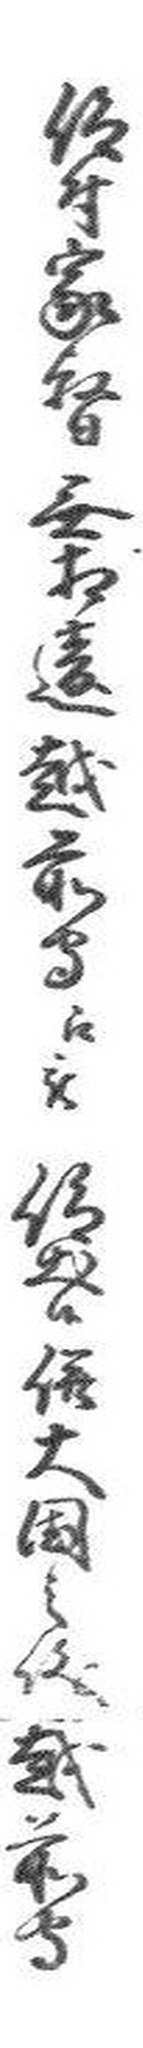仰付家督無相違越前守江被仰出候併大国之儀越前守
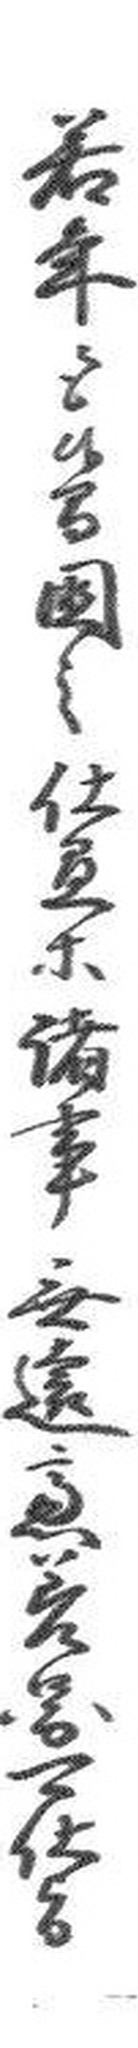若年ニも候間国之仕置等諸事無遠慮差図可仕旨
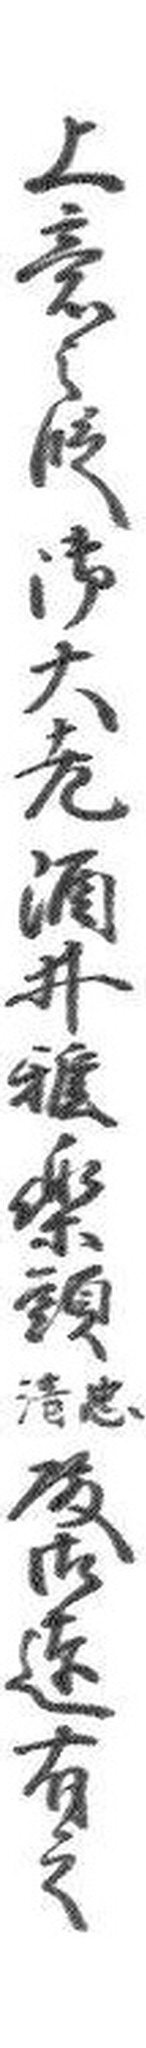上意之段御大老酒井雅樂頭忠清殿御達有之
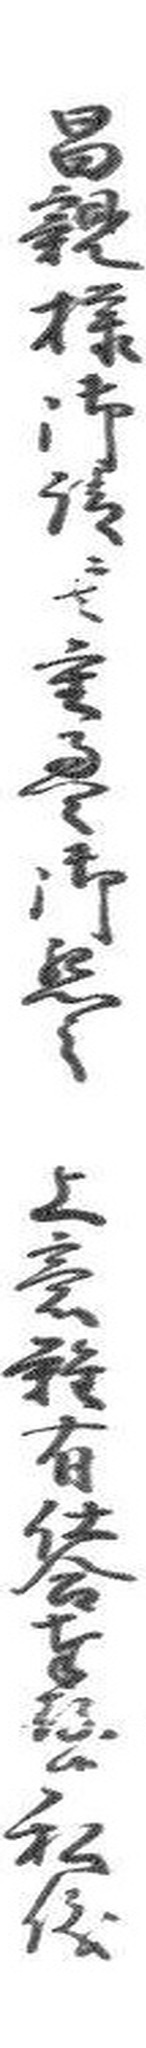昌親様御請ニ者重畳御懇之上意難有仕合奉存候私儀
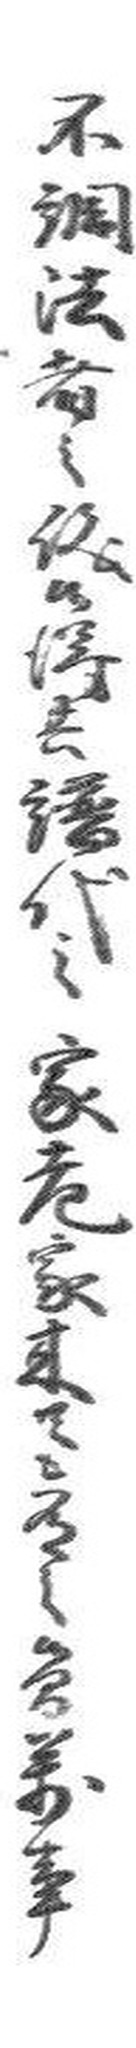不調法者之儀候得共譜代之家老家来共も有之候間万事
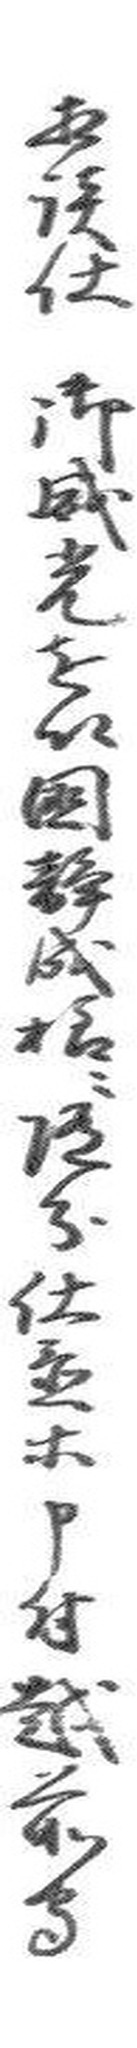相談仕御威光を以国静成様ニ随分仕置等申付越前守
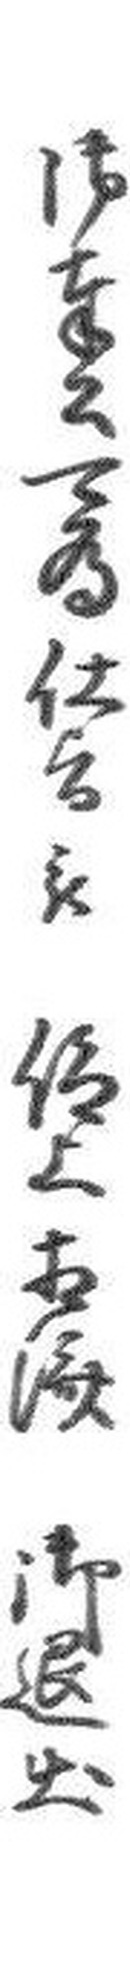御奉公可為仕旨被仰上相済御退出
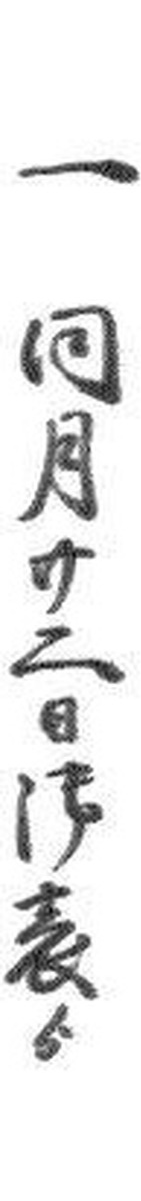一同月廿二日御表ゟ
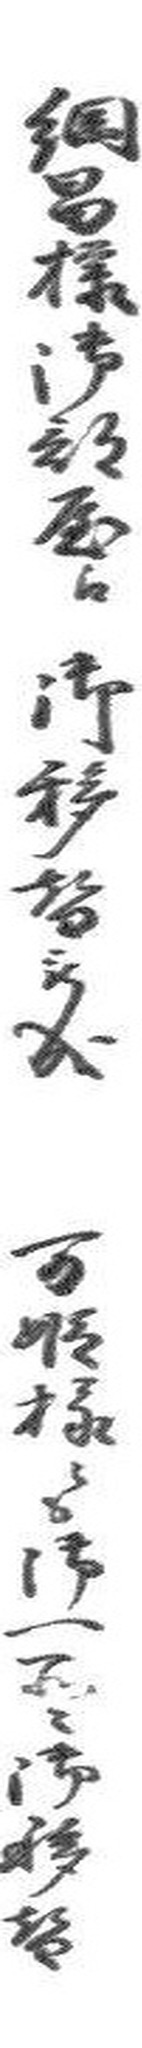綱昌様御部屋江御移替被成万姫様ニも御一所ニ御移替

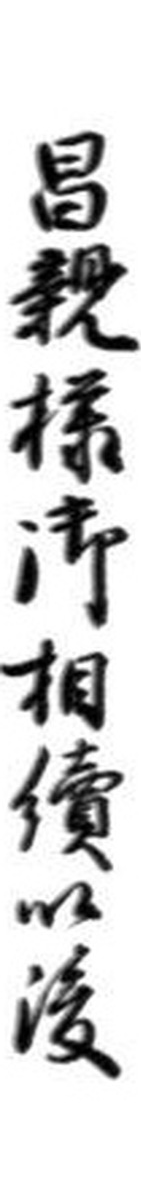昌親様御相続以後
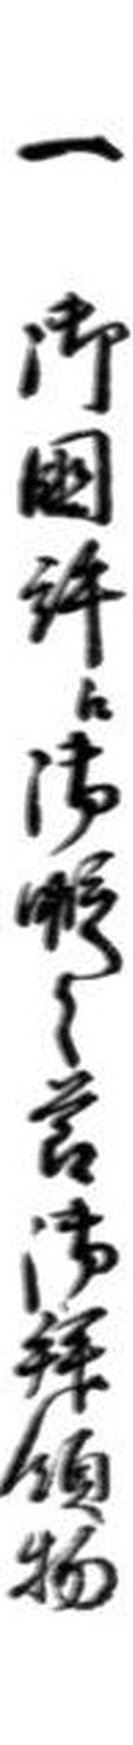一御国許江御暇之節御拝領物
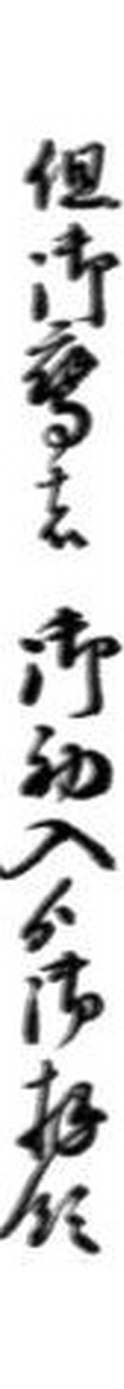但御鷹者御初入ゟ御拝領
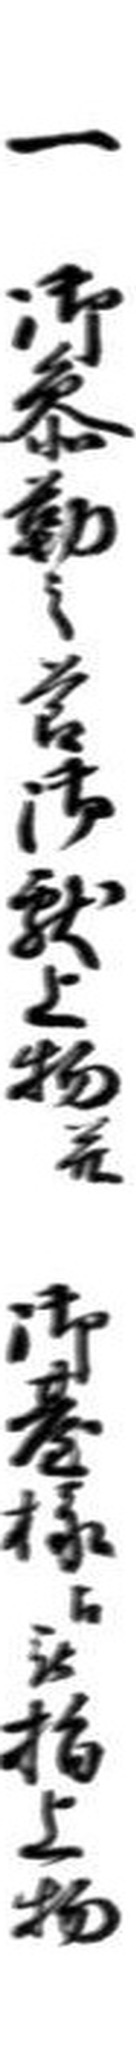一御参勤之節御献上物幷御臺様江指上物
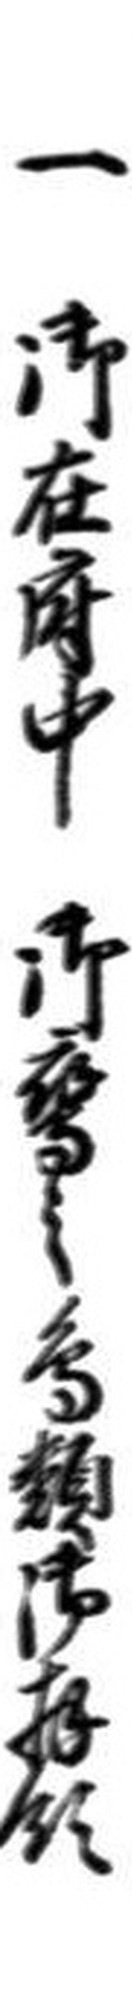一御在府中御鷹之鳥類御拝領
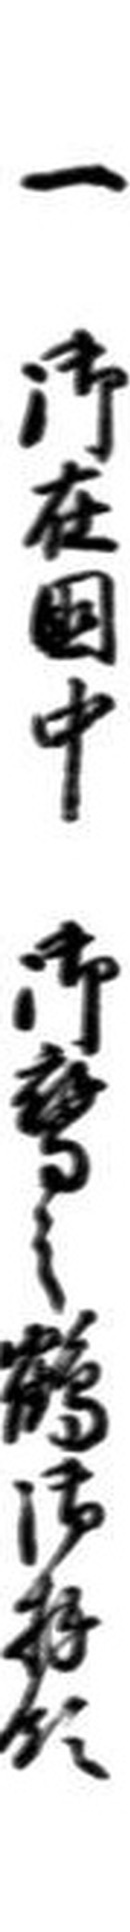一御在国中御鷹之鶴御拝領
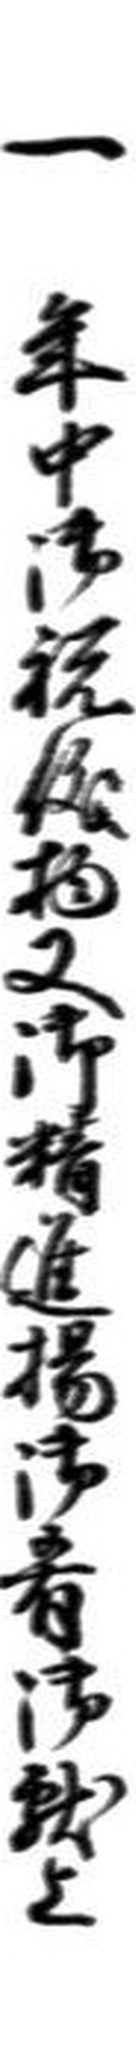一年中御祝儀物又御精進揚御肴御献立
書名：家譜 十一 昌親公 従延宝二年到延宝四年八月
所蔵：福井県文書館 Fukui Prefectural Archives
